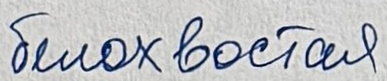белохвостая
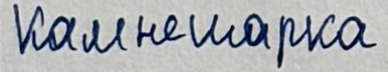камнешарка
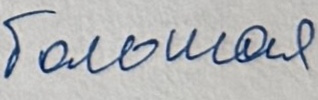большая
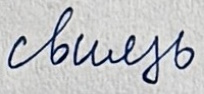свиязь
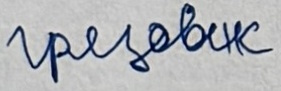грязовик
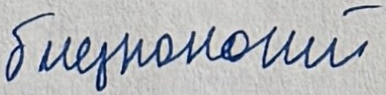бледноногий
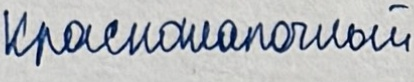красношапочный
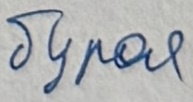бурая
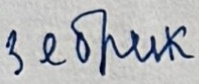зебрик
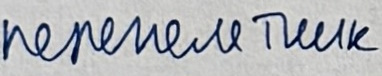перепелятник
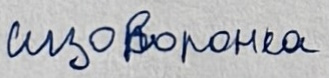сизоворонка
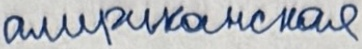американская
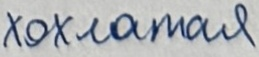хохлатая
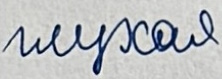глухая
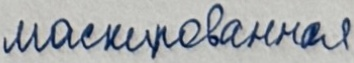маскированная
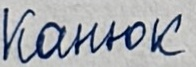канюк
